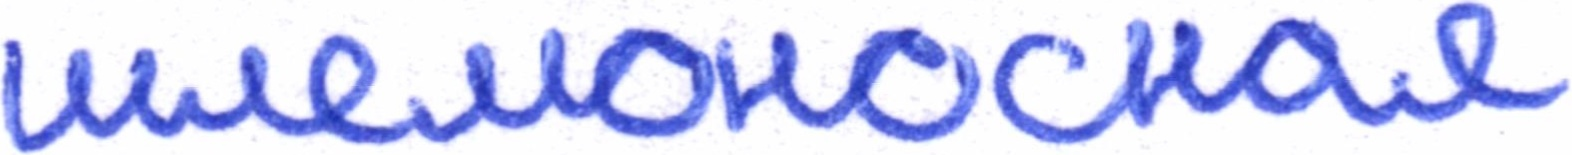шлемоносная
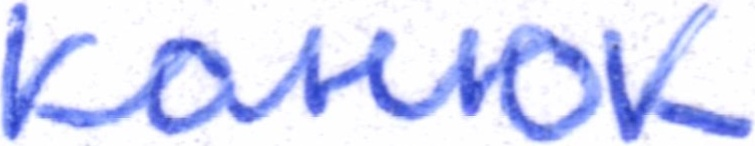канюк
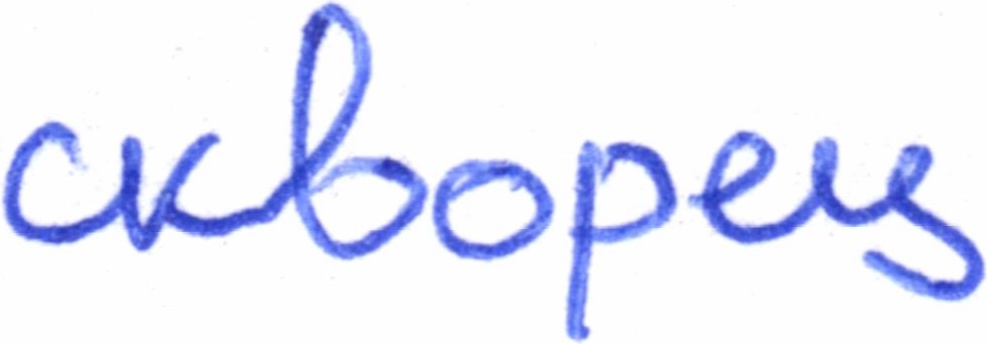скворец
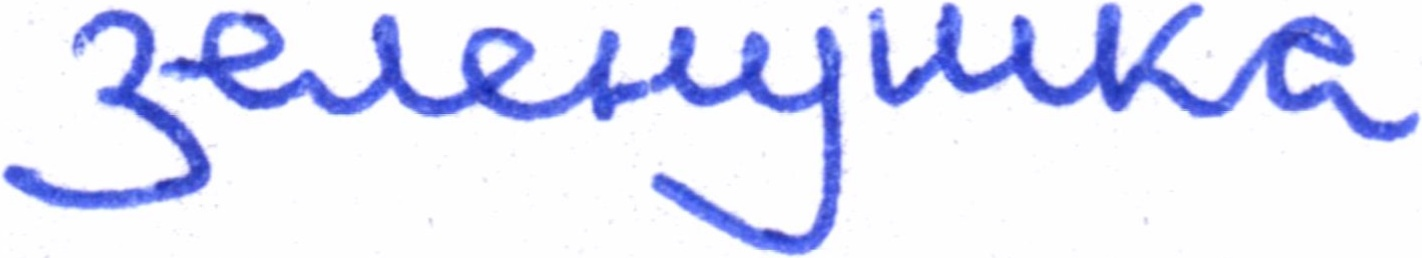зеленушка
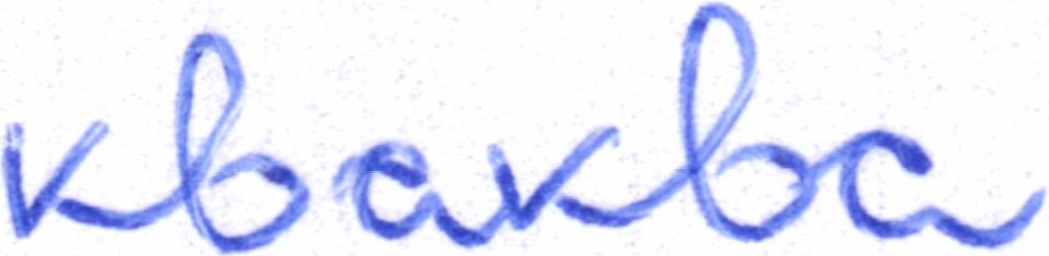кваква
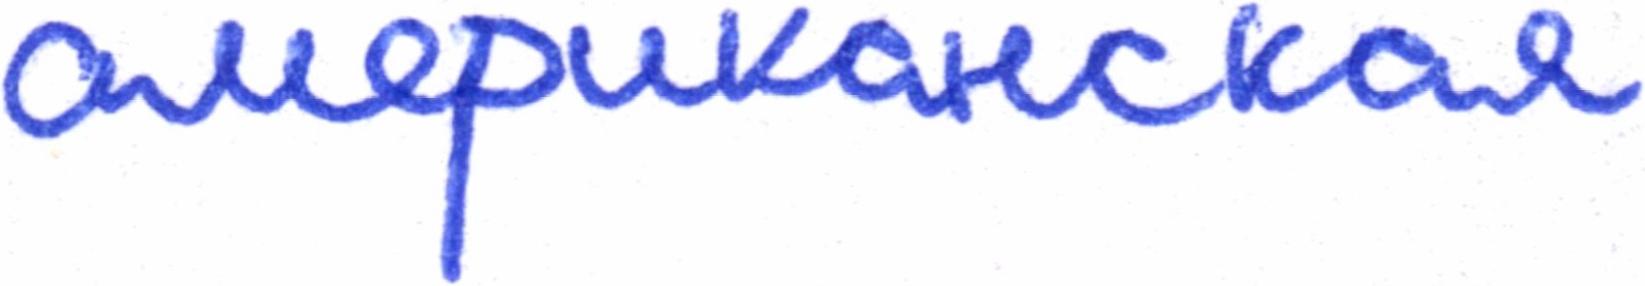американская
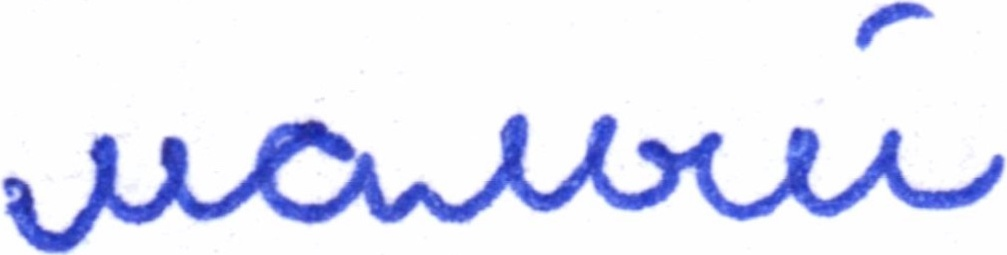малый
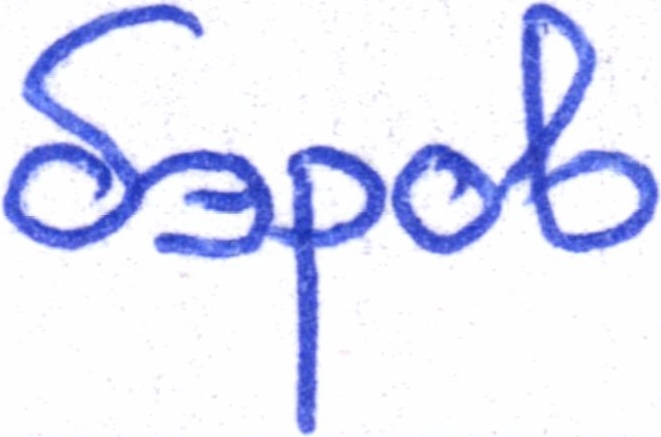бэров
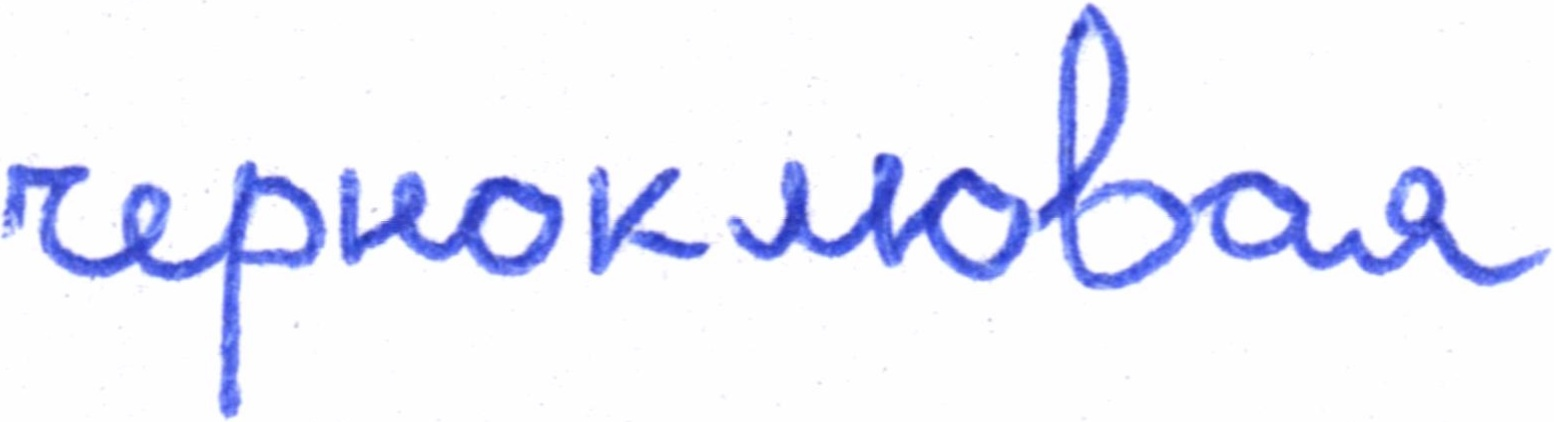черноклювая
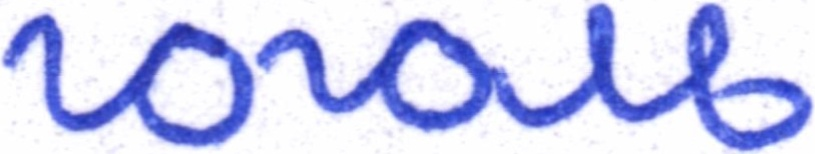гоголь
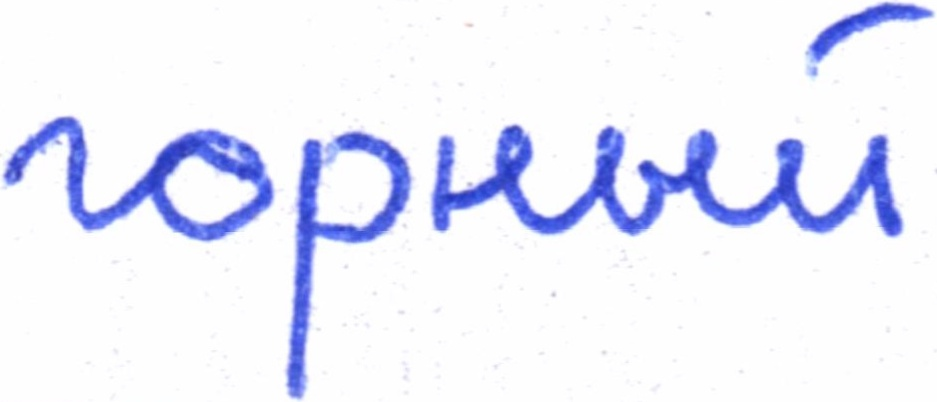горный
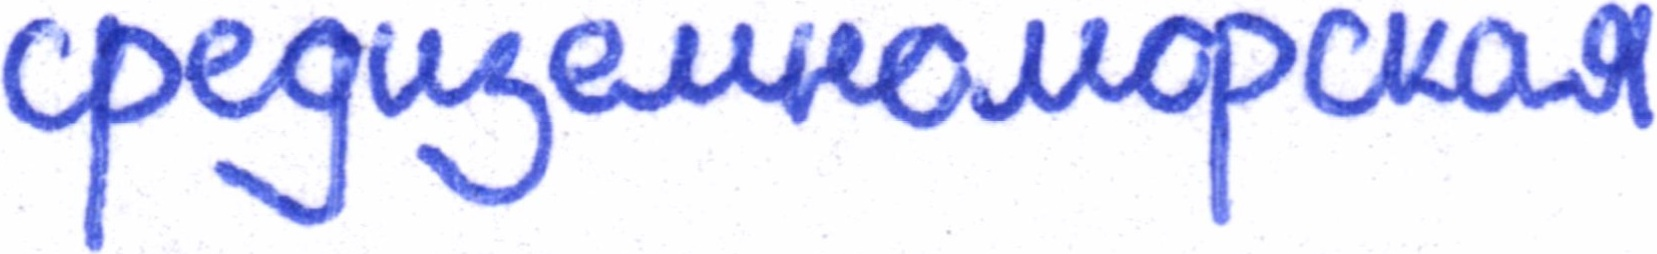средиземноморская
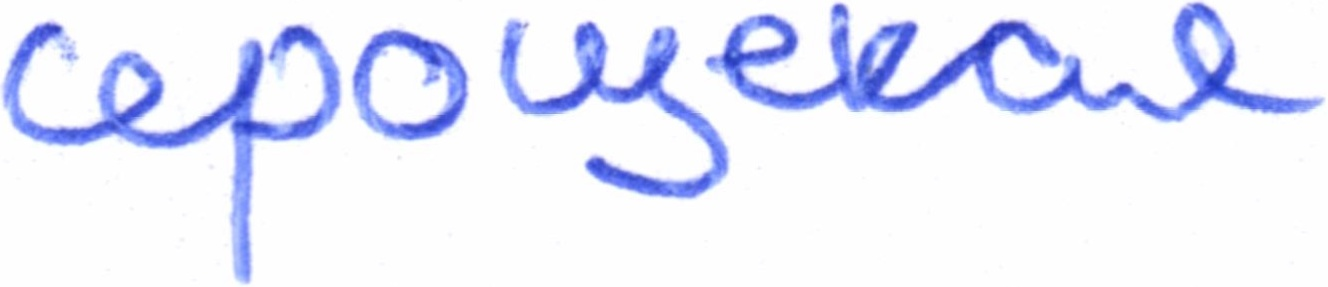серощекая
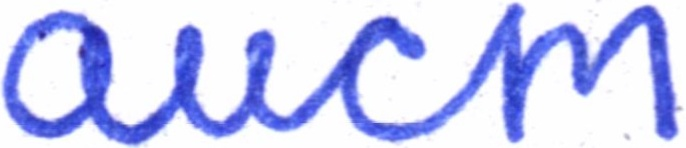аист
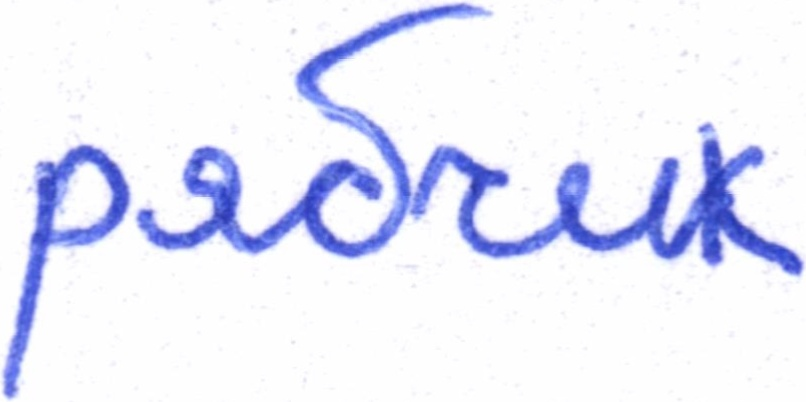рябчик
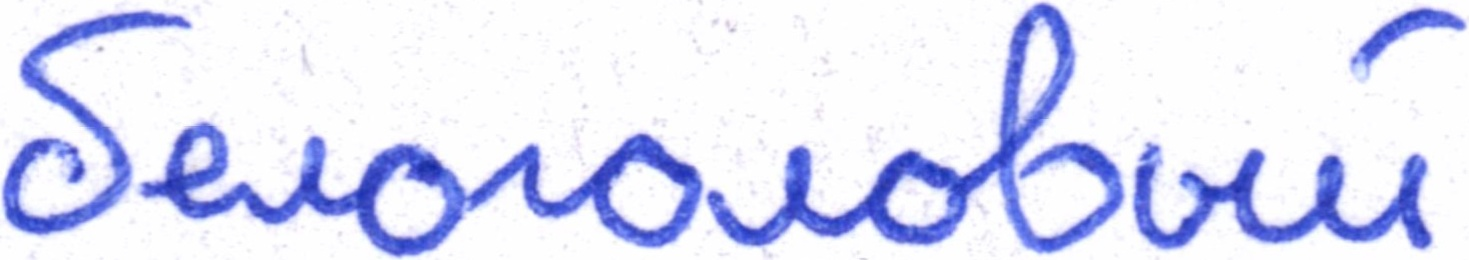белоголовый
